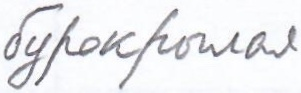бурокрылая
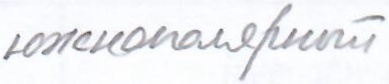южнополярный
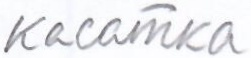касатка
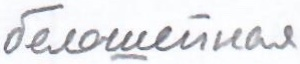белошейная
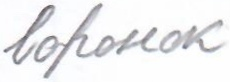воронок
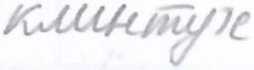клинтух
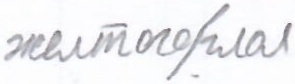желтогорлая
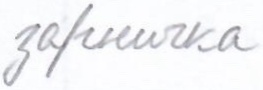зарничка
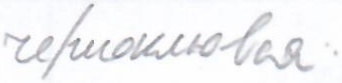черноклювая
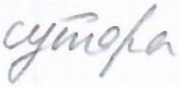сутора
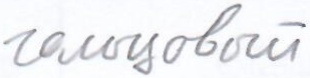гольцовый
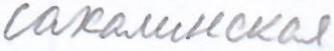сахалинская
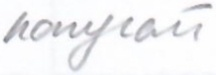попугай
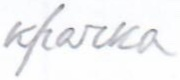крачка
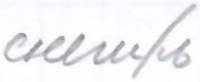снегирь
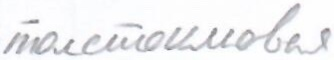толстоклювая
